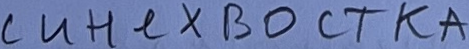синехвостка
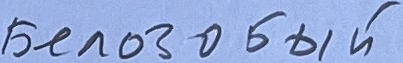белозобый
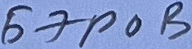бэров
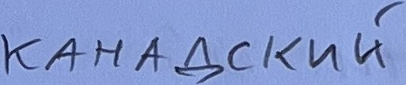канадский
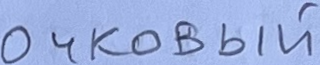очковый
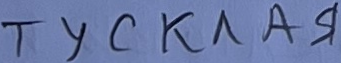тусклая
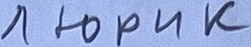люрик
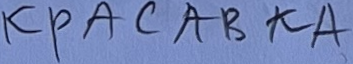красавка
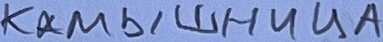камышница
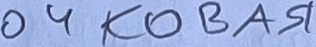очковая
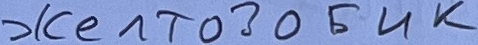желтозобик
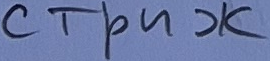стриж
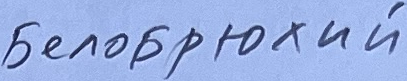белобрюхий
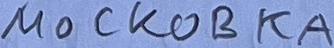московка
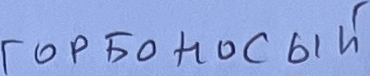горбоносый
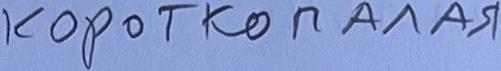короткопалая
